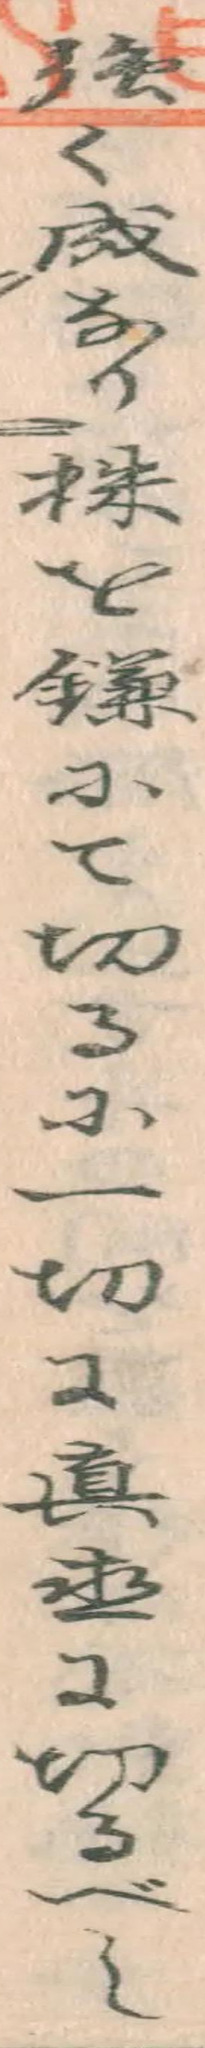強く成なり株を鎌にて切るに一切に真直に切るべし
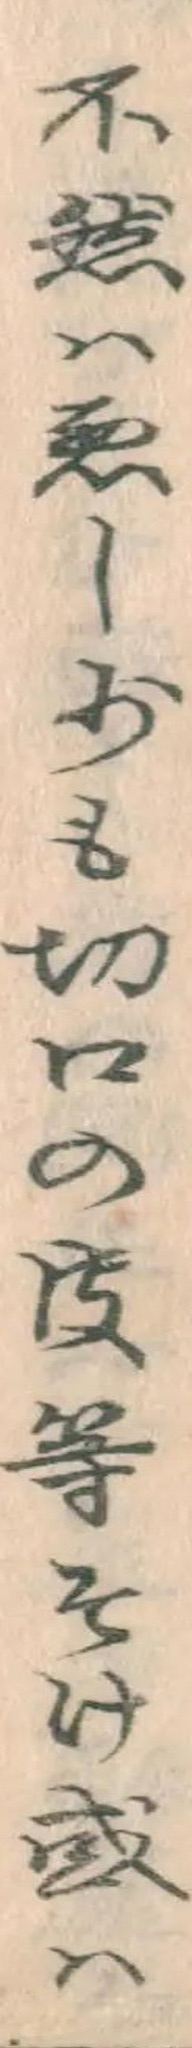不然は悪し少も切口の皮等そけ或は
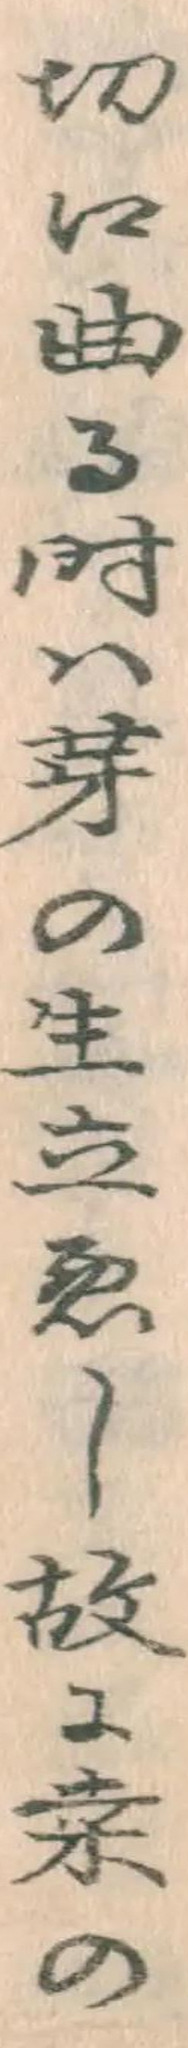切口曲る時は芽の生立悪し故に桑の
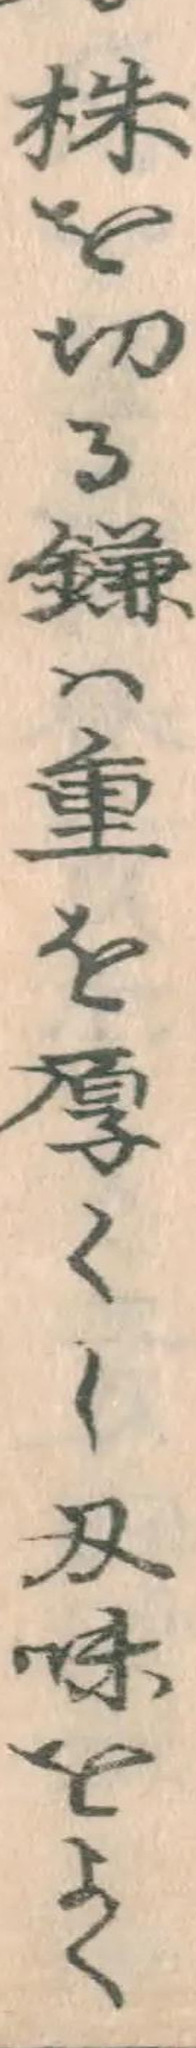株を切る鎌は重を厚くし刃味をよく
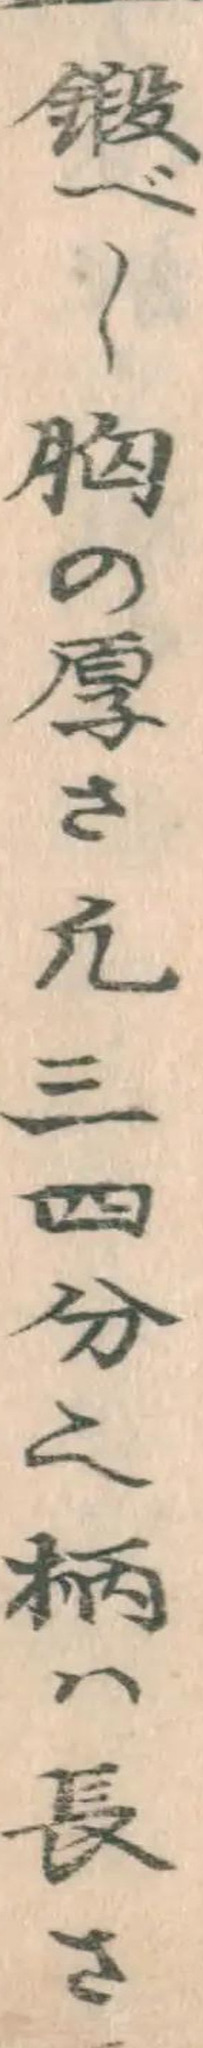鍛べし胸の厚さ凡三四分之柄は長さ
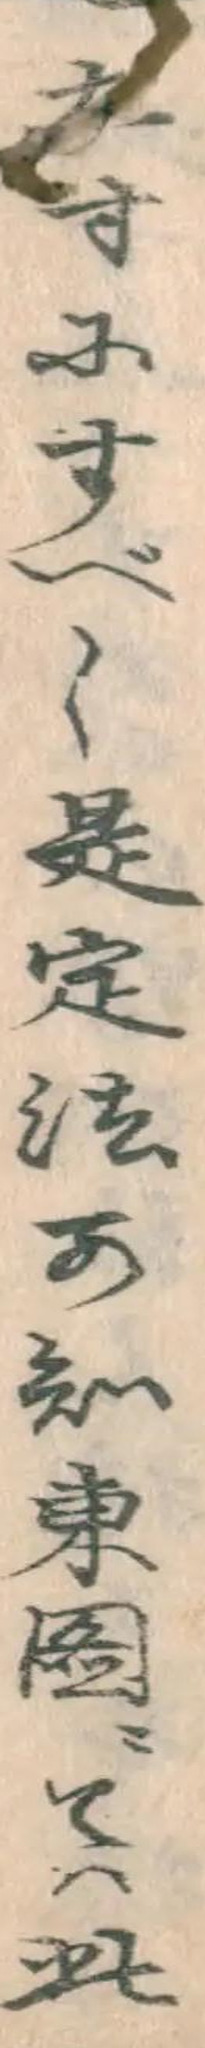九寸にすべし是定法可知東図にては此
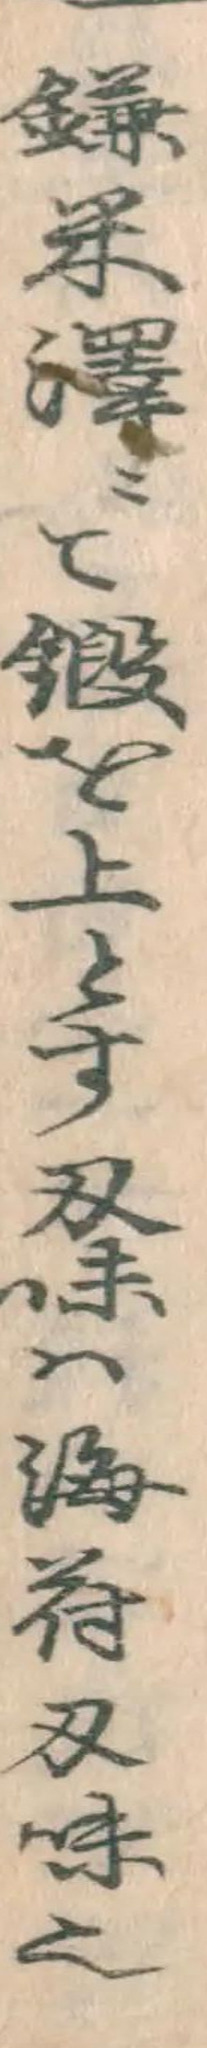鎌米沢にて鍛を上とす刃味は海苻刃味也

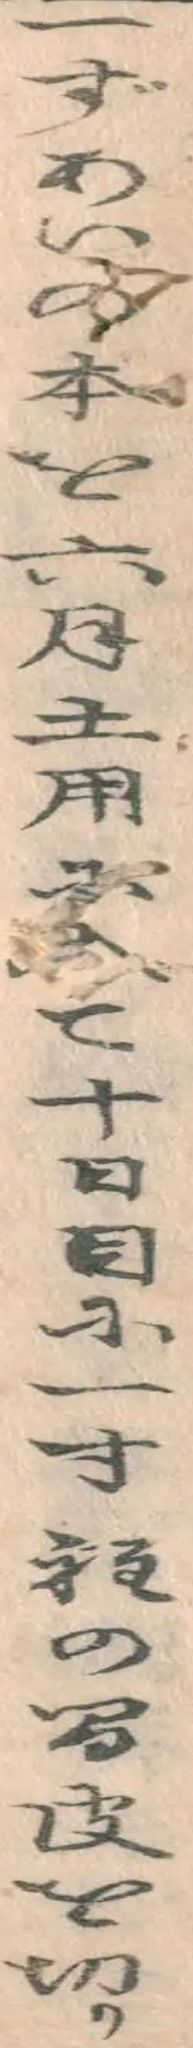一ずあいの本を六月土用に入て十日目に一寸程の間皮を切り
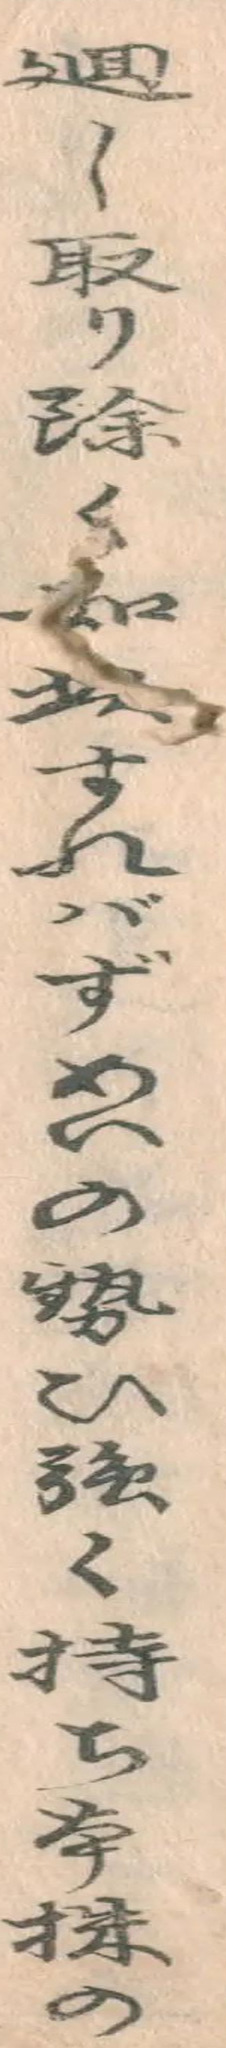廻し取り除く如此すればずあいの勢ひ強く持ち本株の
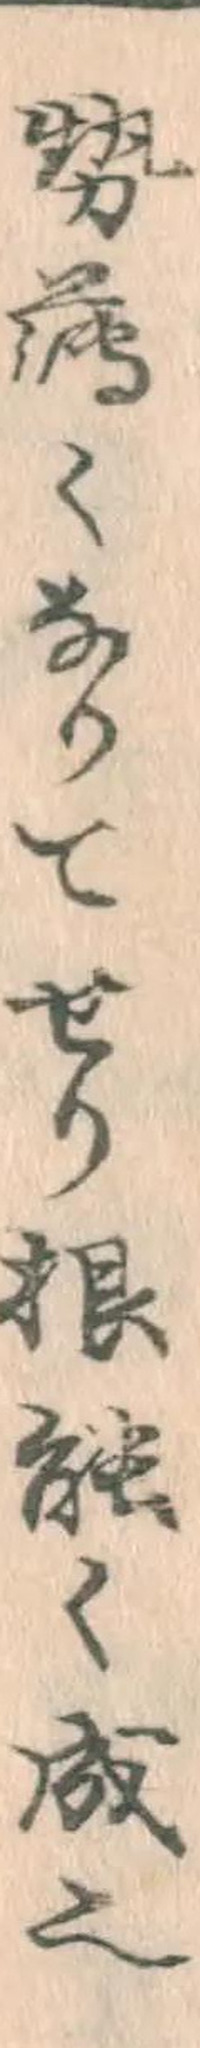勢薄くなりてせり根能く成也
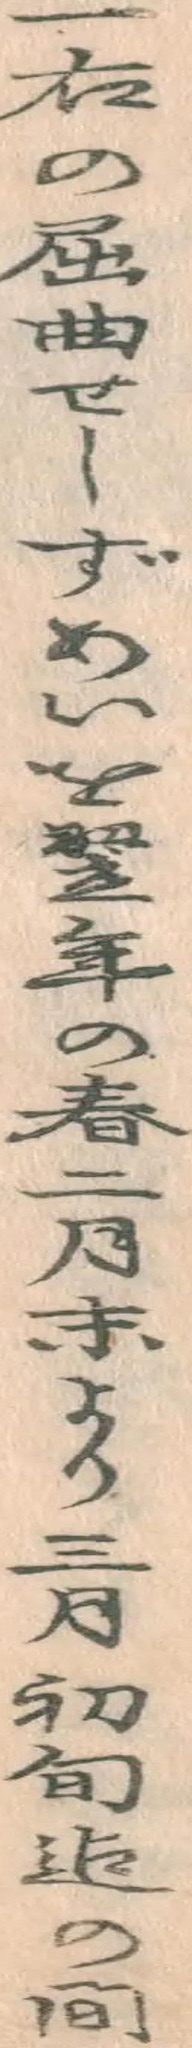一右の屈曲せしずあいを翌年の春二月末より三月初旬迄の間に
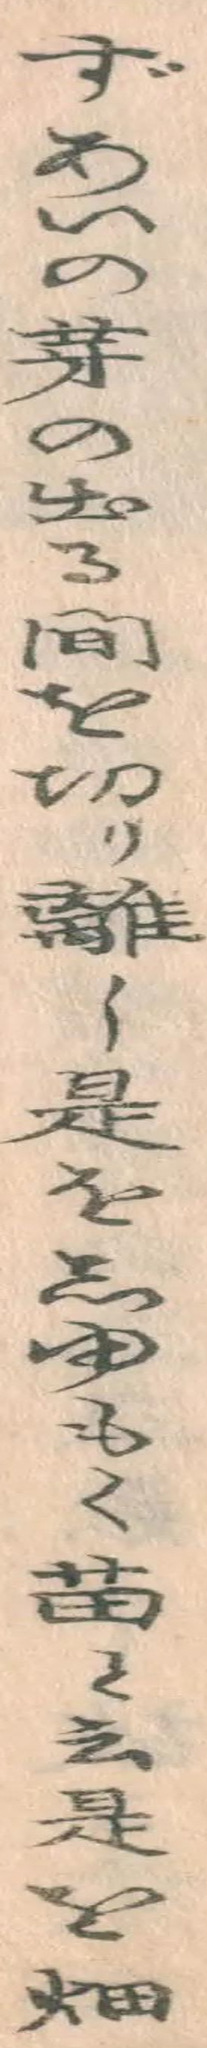ずあいの芽の出る間を切り離し是をしゆもく苗と云是を畑
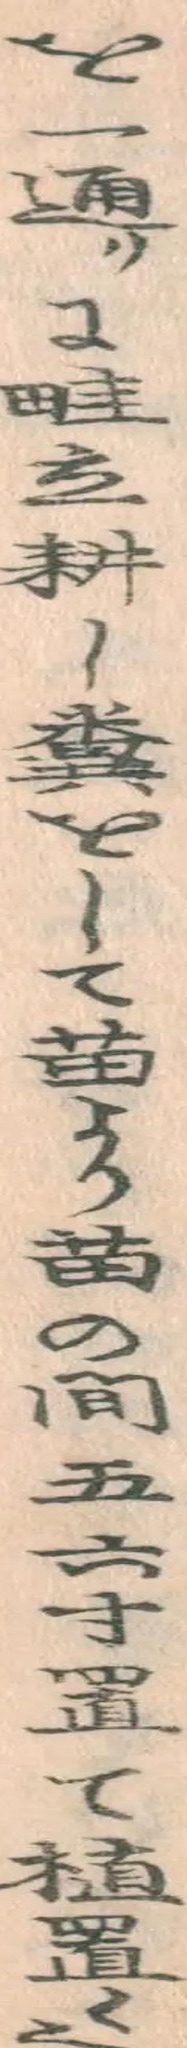を一通りに畦立耕し糞をして苗より苗の間五六寸置て植置く也
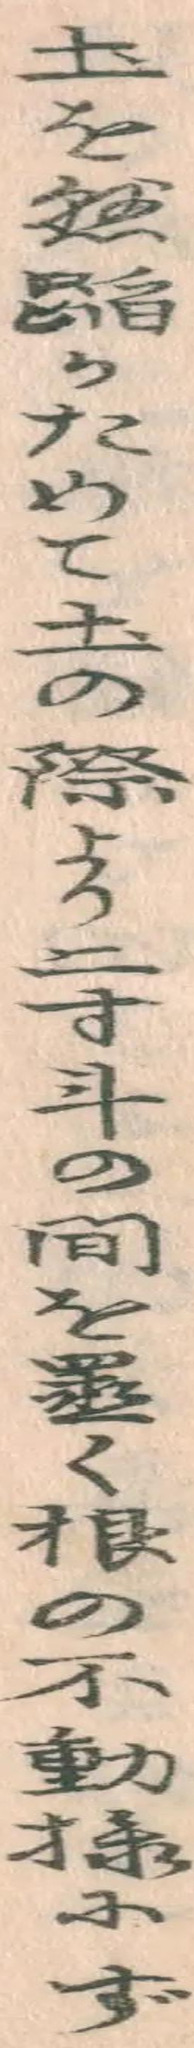土を懸蹈かためて土の際より二寸斗の間を置く根の不動様にず
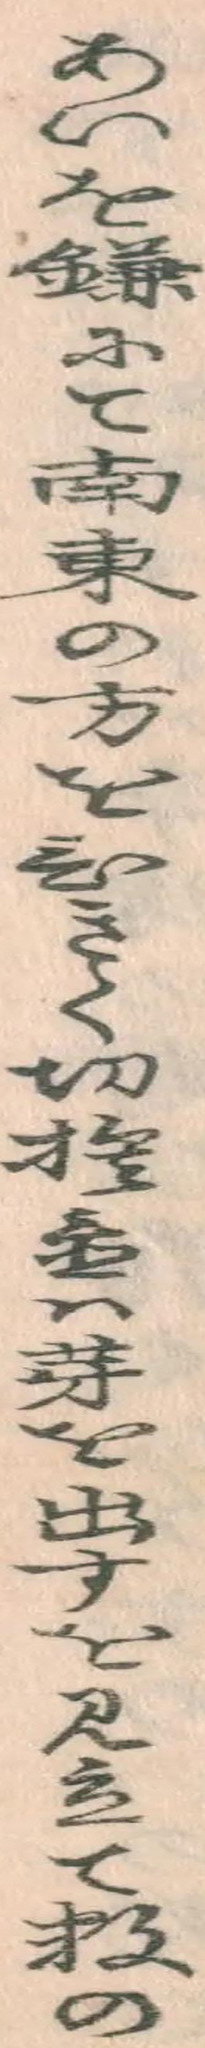あいを鎌にて南東の方をひきく切捨置は芽を出すを見立て数の
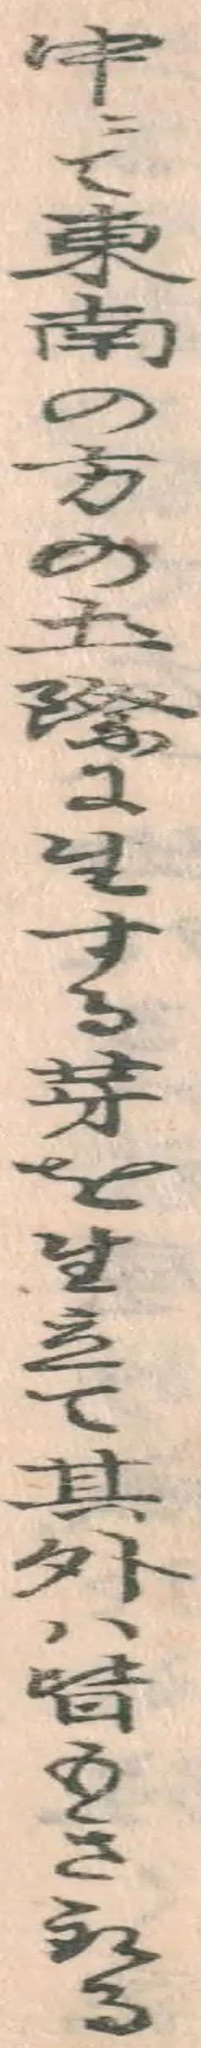中にて東南の方の土際に生する芽を生立て其外は皆もき取る
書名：機織彙編 5巻. [1]
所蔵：国立国会図書館 National Diet Library, JAPAN
